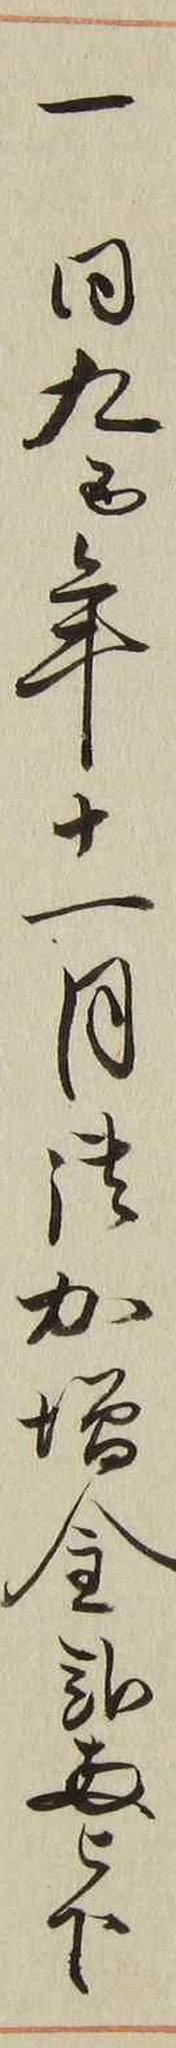一同九酉年十一月御加増金弐両被下
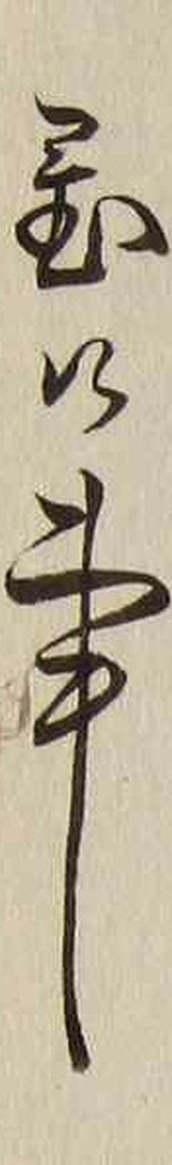置候事
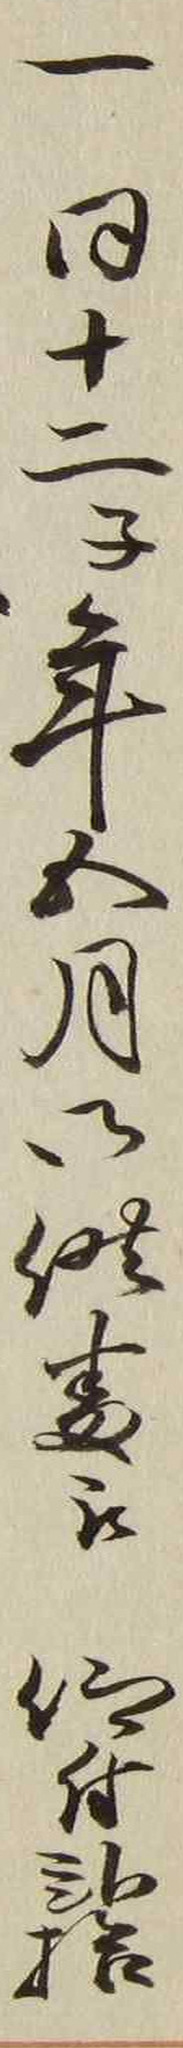一同十二子年五月御供番被仰付弐拾
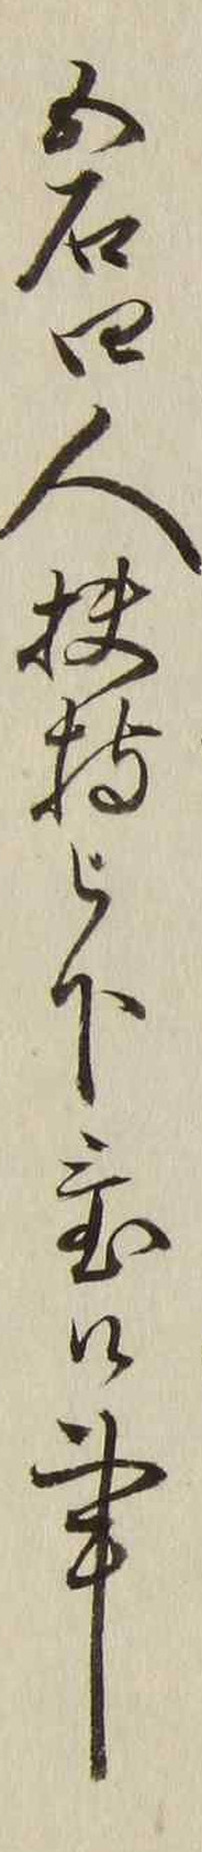五石四人扶持被下置候事

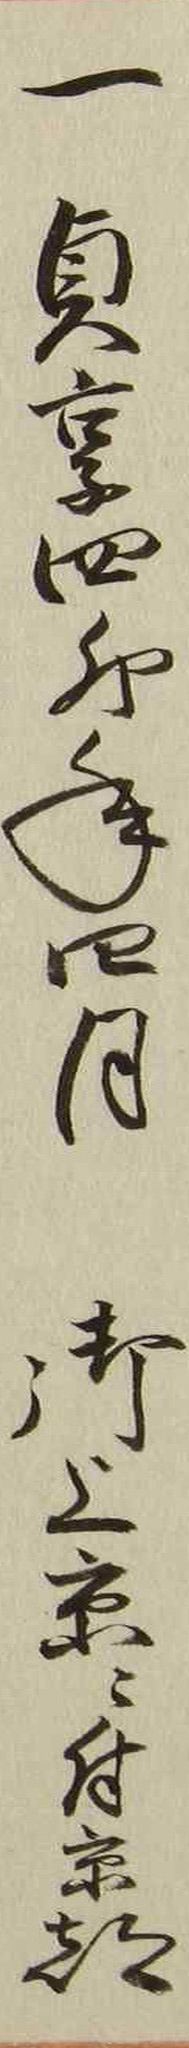一貞享四卯年四月御上京ニ付京都
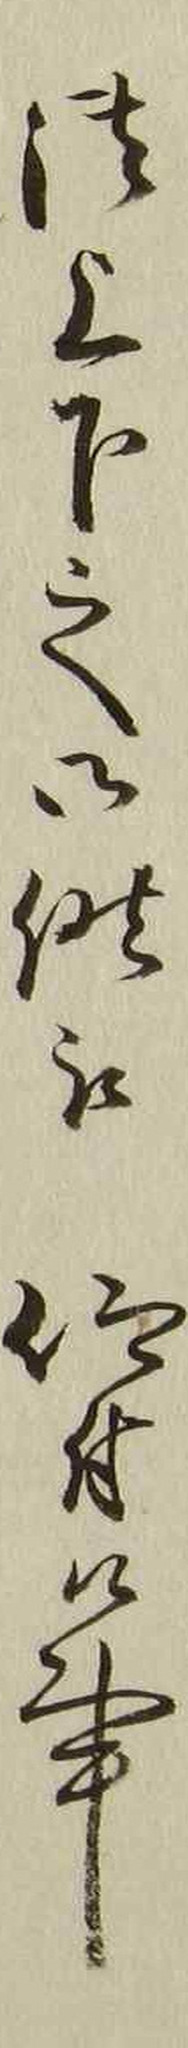御上下之御供被仰付候事
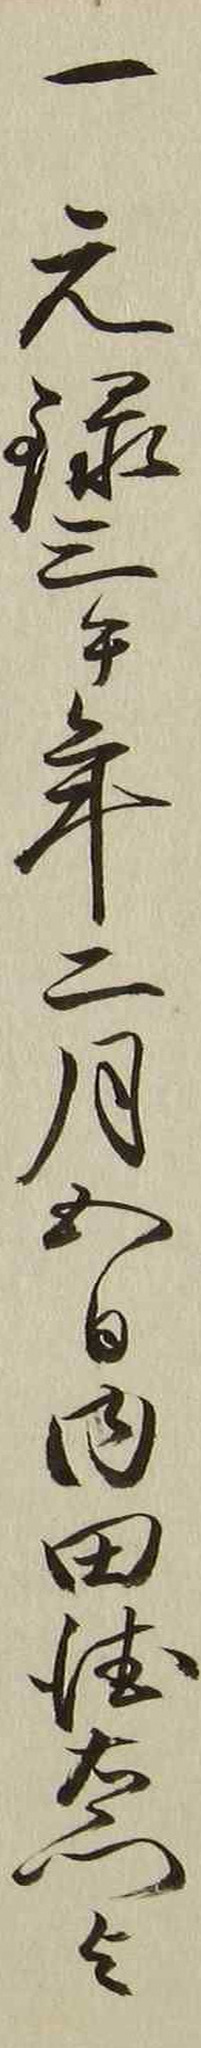一元禄三午年二月五日内田徳右衛門与
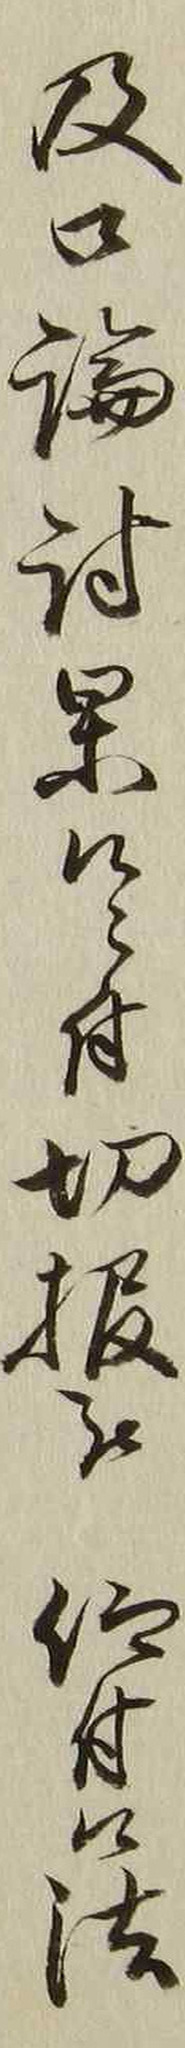及口論討果候ニ付切服被仰付候法
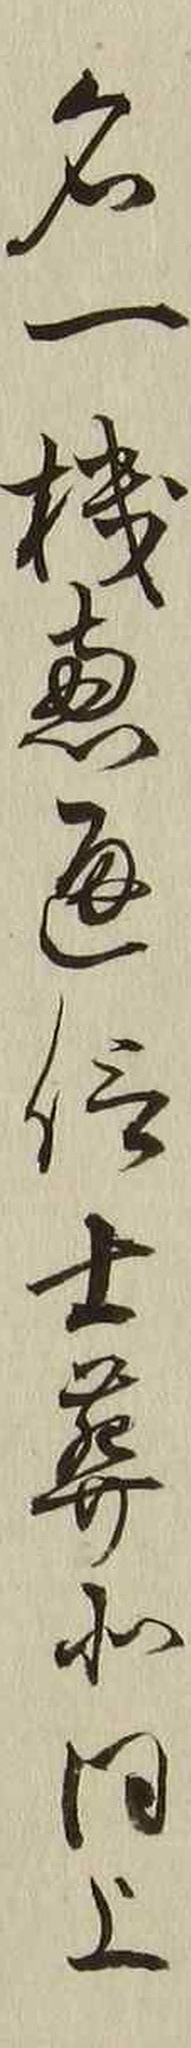名一機恵通信士葬所同上
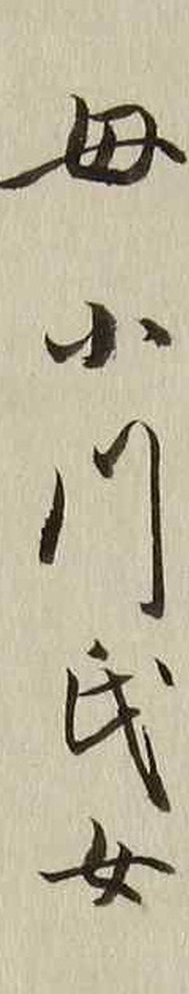母小川氏女
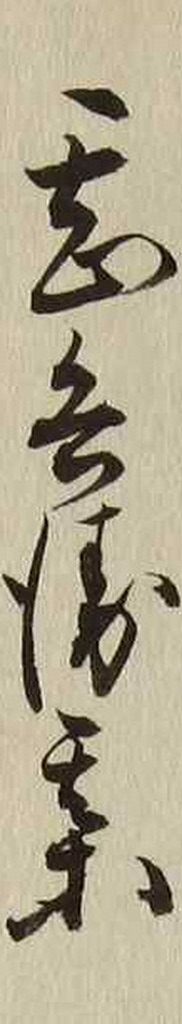甚兵衛某
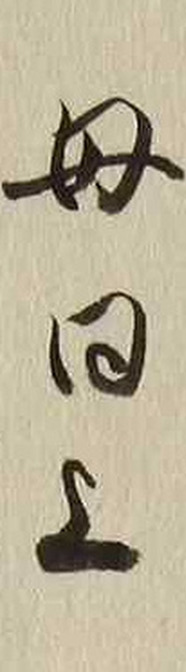母同上
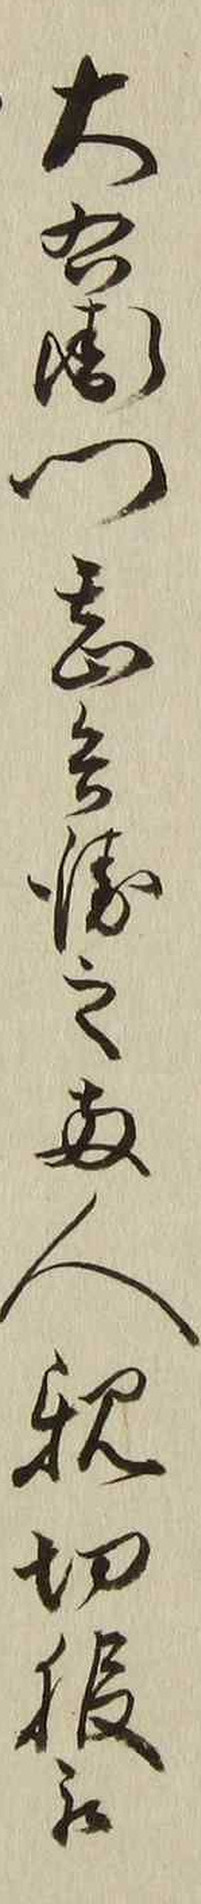大右衛門甚兵衛之両人親切服被
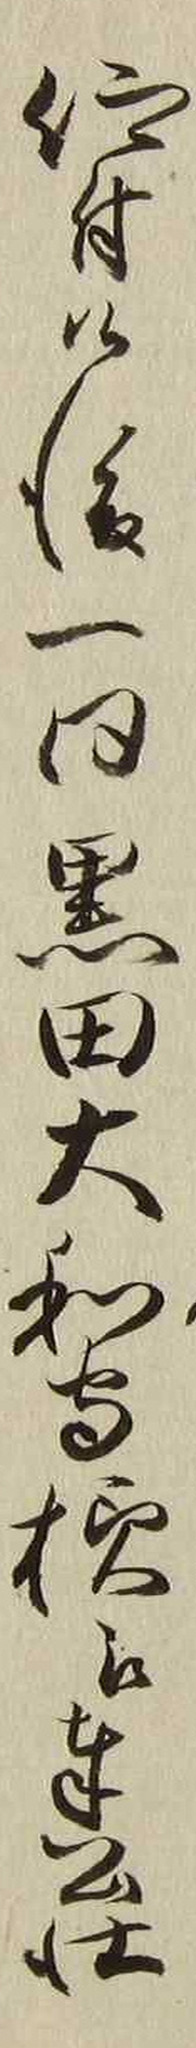仰付候後一同黒田大和守様江奉公仕
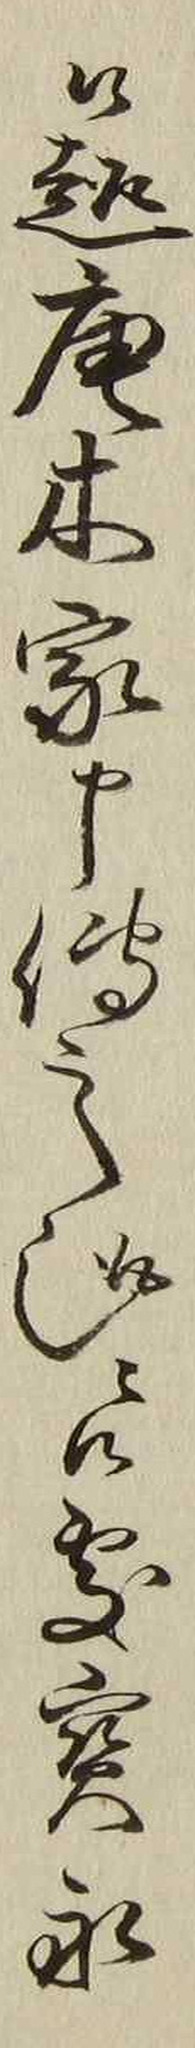候趣唐木家申伝之趣ニ候処宝永
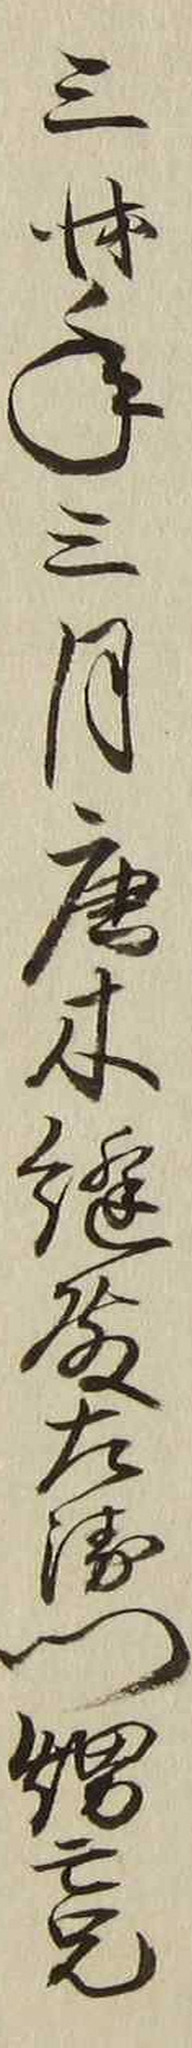三戌年三月唐木縫殿左衛門甥亡兄
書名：諸士系譜　巻之60　と之部3
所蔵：会津若松市立会津図書館
